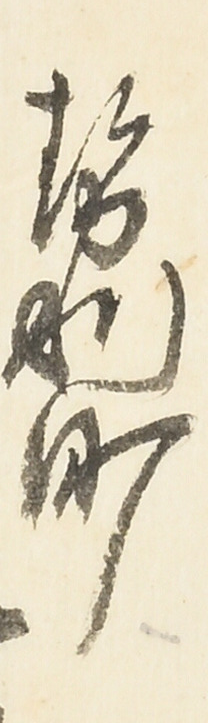勢利町
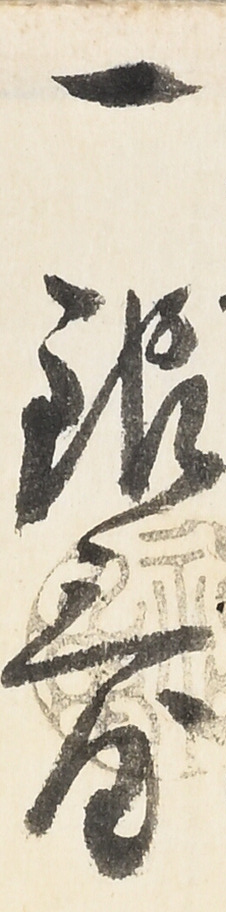一銀六匁
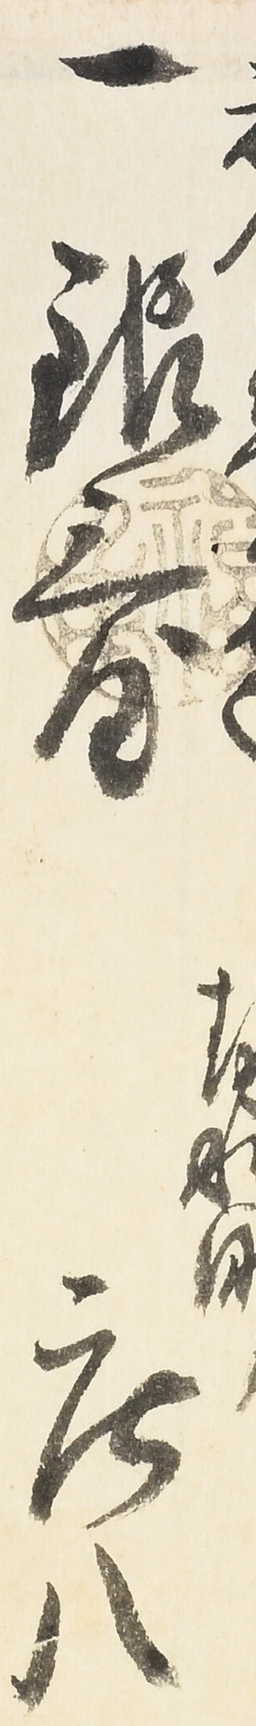一銀三匁庄八
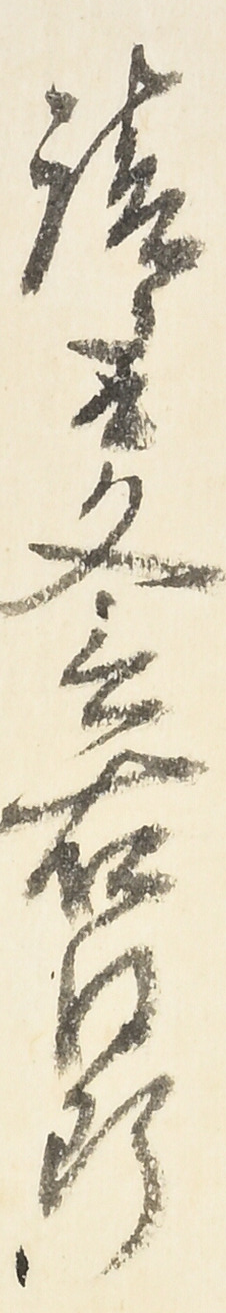請取文言右同断
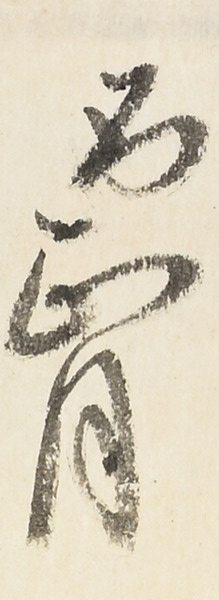酉正月
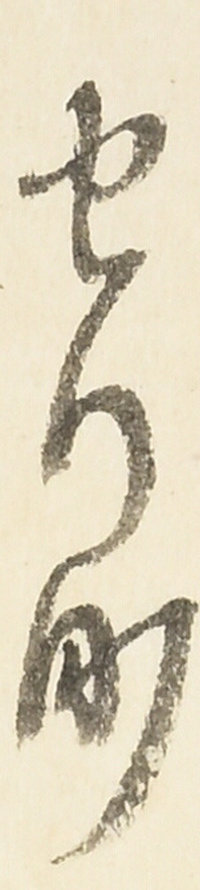せり町
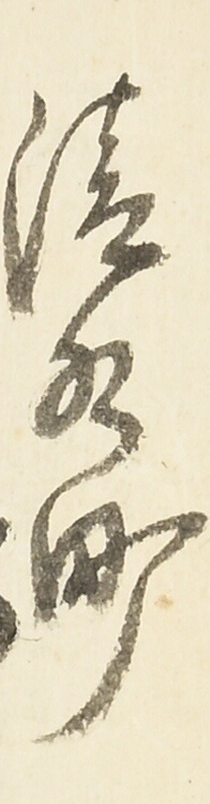清水町
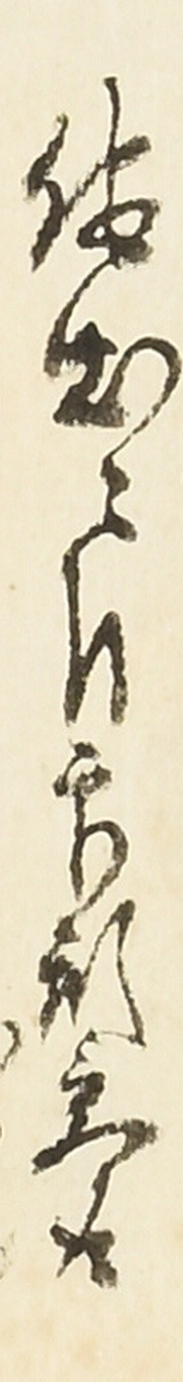備出ニ付印形受取
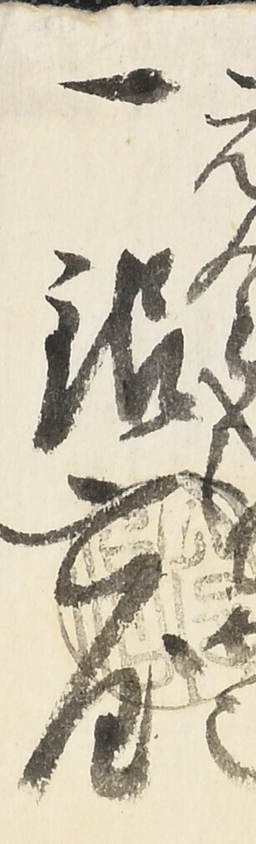一銀六匁
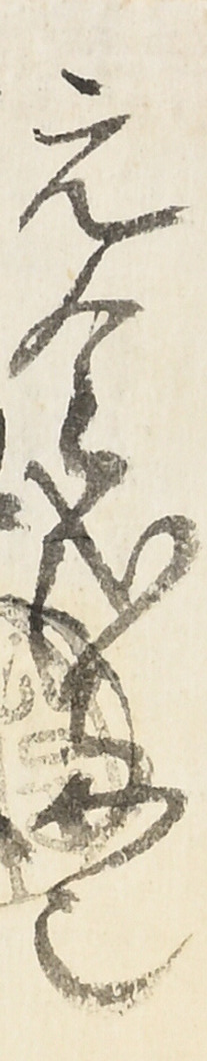元金壱両也
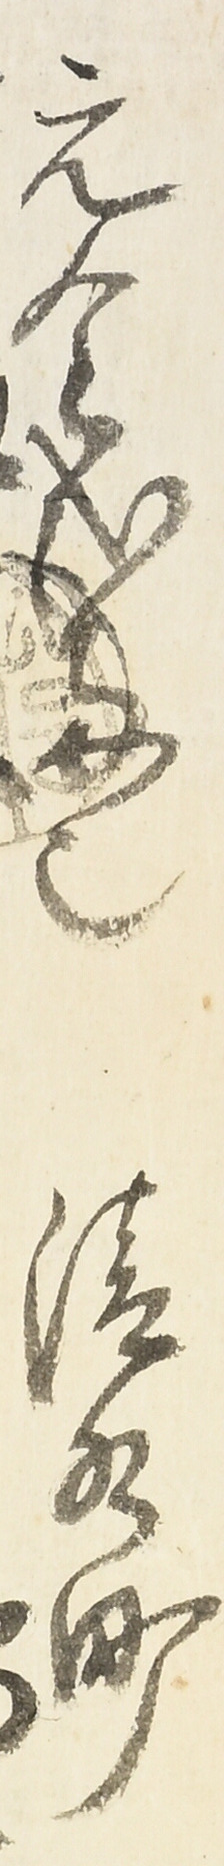元金弐両也清水町
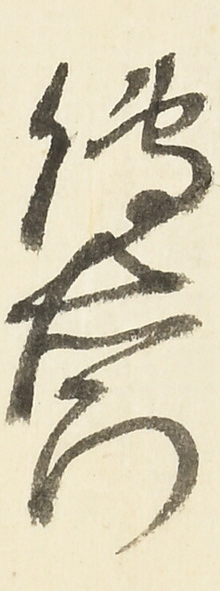伝右衛門
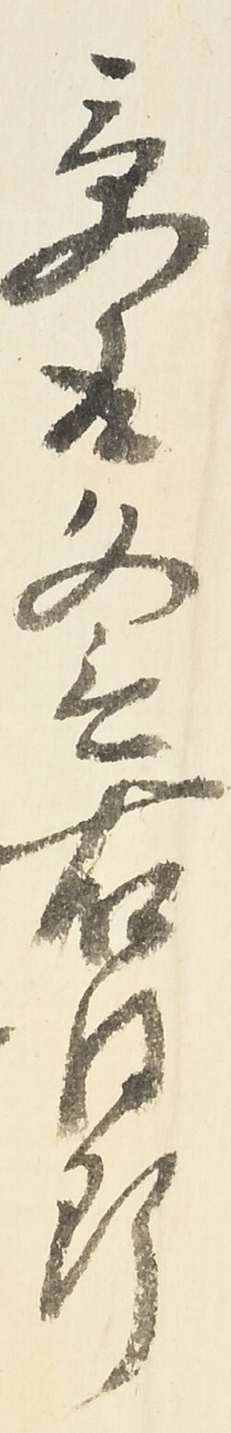請取文言右同断
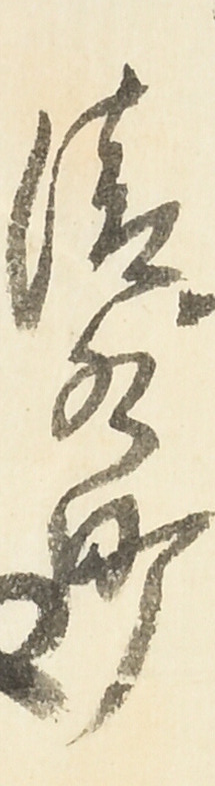清水町
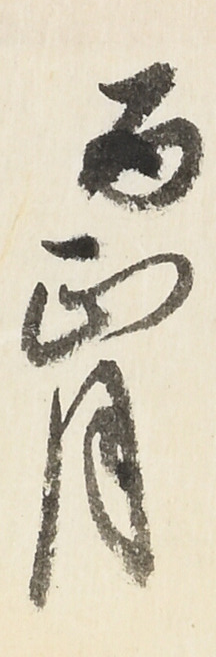酉正月
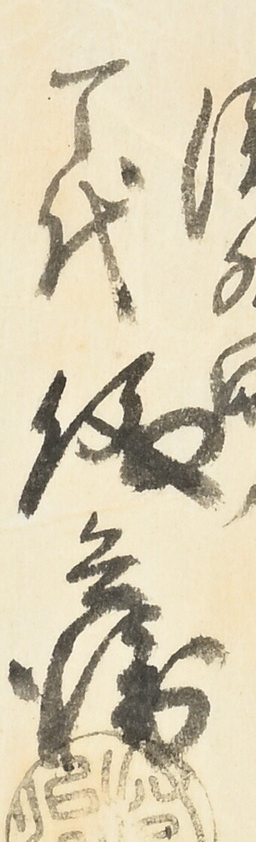丁代儀兵衛
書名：御才覚金御利足割渡扣帳
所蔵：伊那市立高遠町図書館・合同会社AMANE
